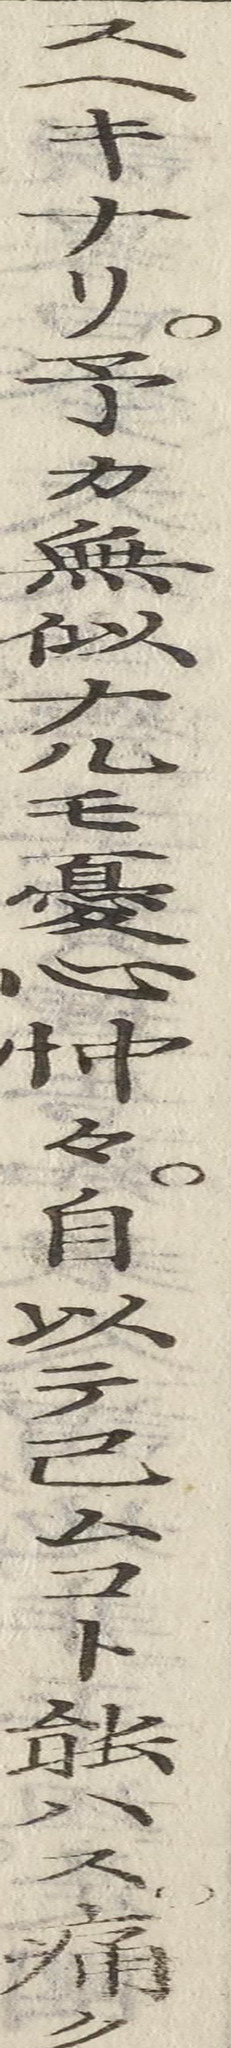スヘキナリ。予カ無似ナルモ憂心忡々。自以テ己ムコト能ハス痛ク
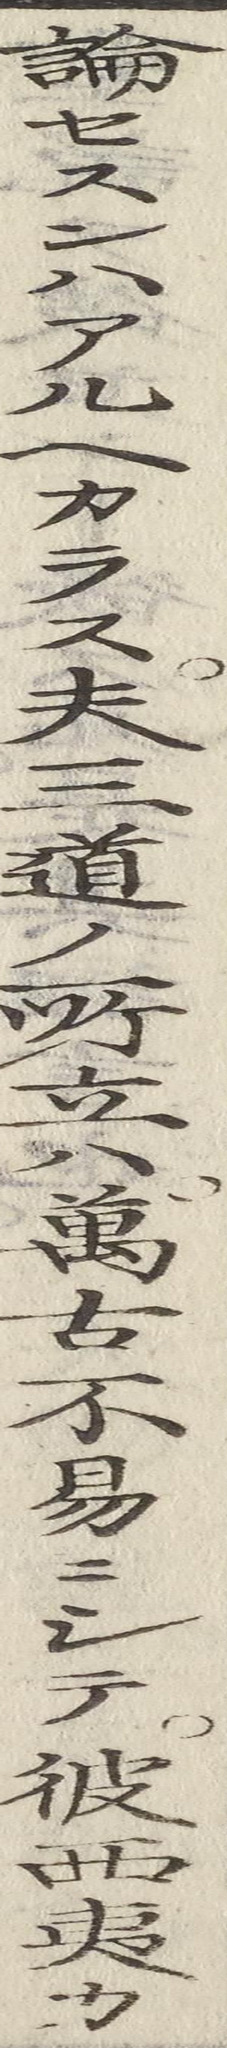論セスンハアルヘカラス。夫三道ノ所立ハ。万古不易ニシテ。彼西夷カ
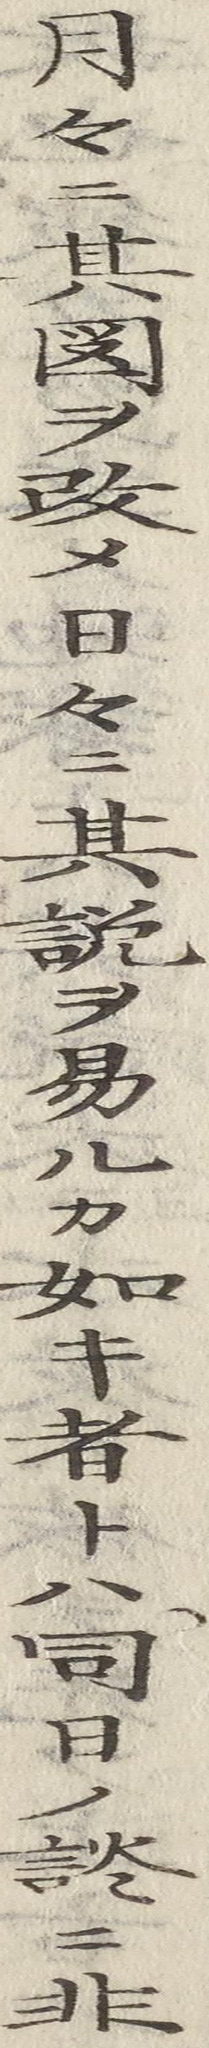月々ニ其図ヲ改メ日々ニ其説ヲ易ルカ如キ者トハ。同日ノ談ニ非
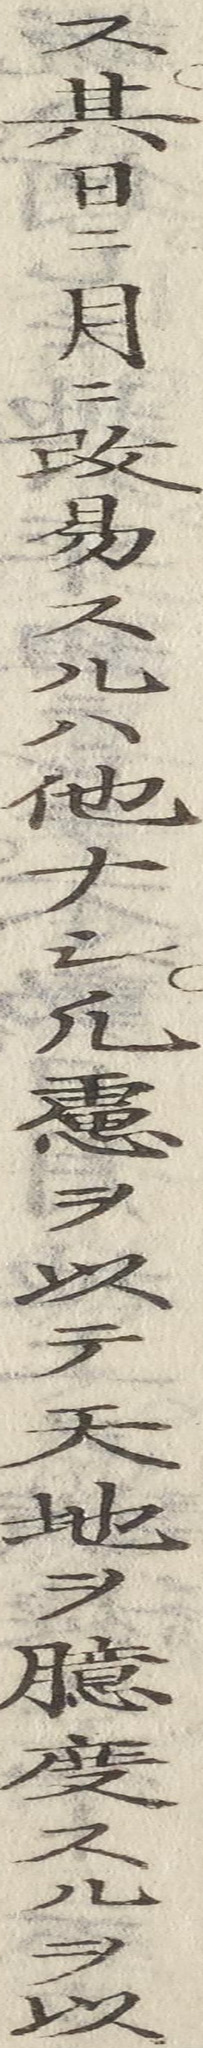ス。其日ニ月ニ改易スルハ他ナシ。凡慮ヲ以テ天地ヲ臆度スルヲ以
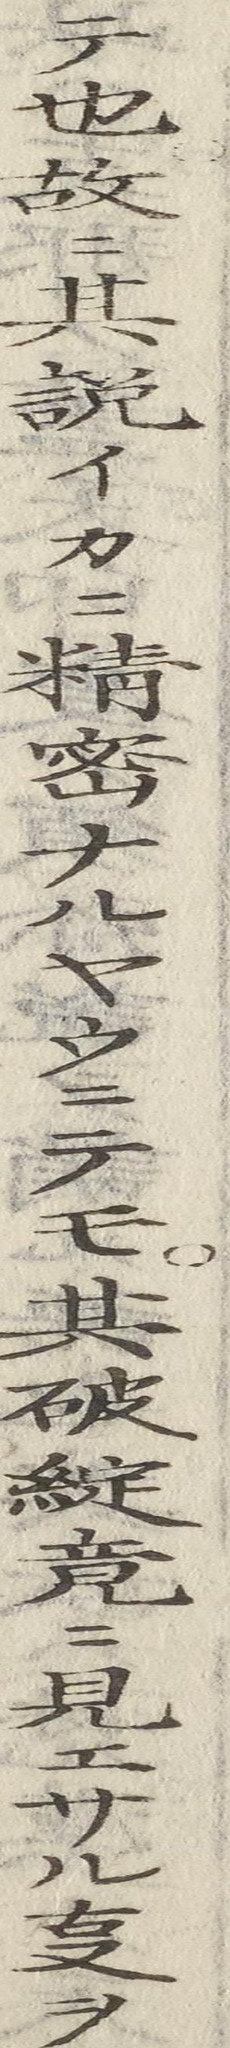テ也故ニ其説イカニ精密ナルヤウニテモ。其破綻竟ニ見エサル事ヲ
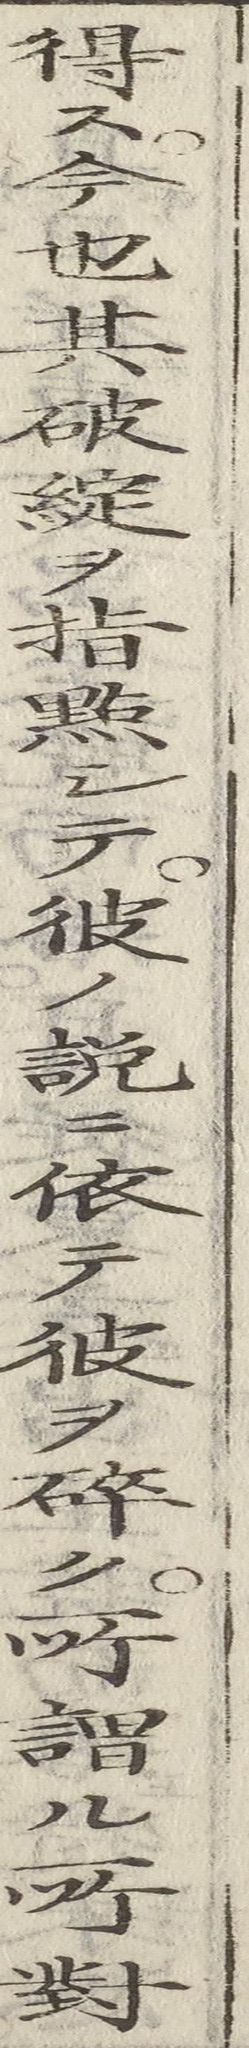得ス。今也其破綻ヲ指点シテ。彼ノ説ニ依テ彼ヲ砕ク。所謂ル所対
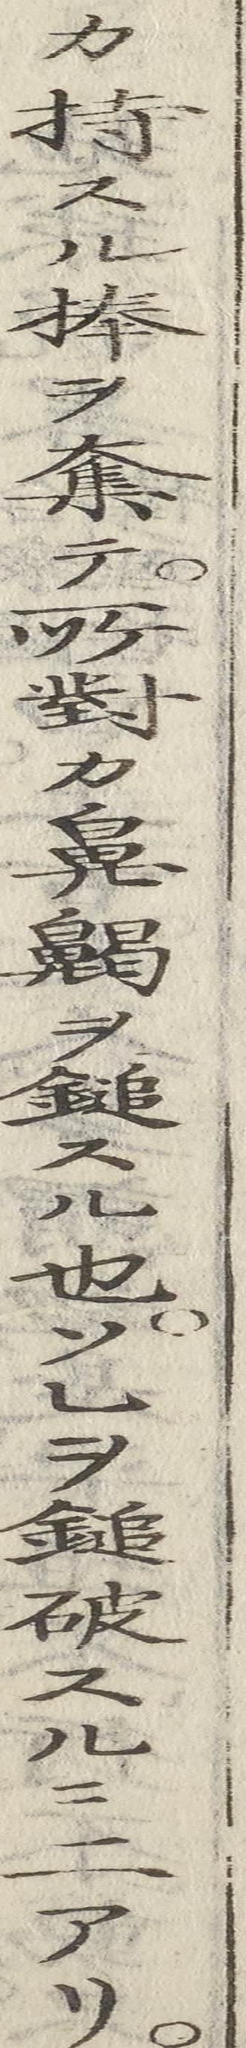カ持スル棒ヲ奪テ。所対カ鼻齃ヲ鎚スル也。ソレヲ鎚破スルニ二アリ。
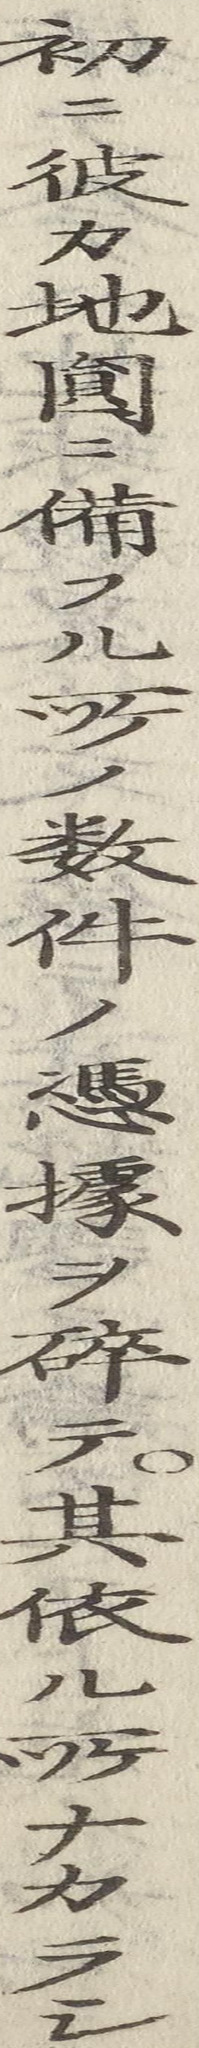初ニ彼カ地円ニ備フル所ノ数件ノ憑拠ヲ砕テ。其依ル所ナカラシ
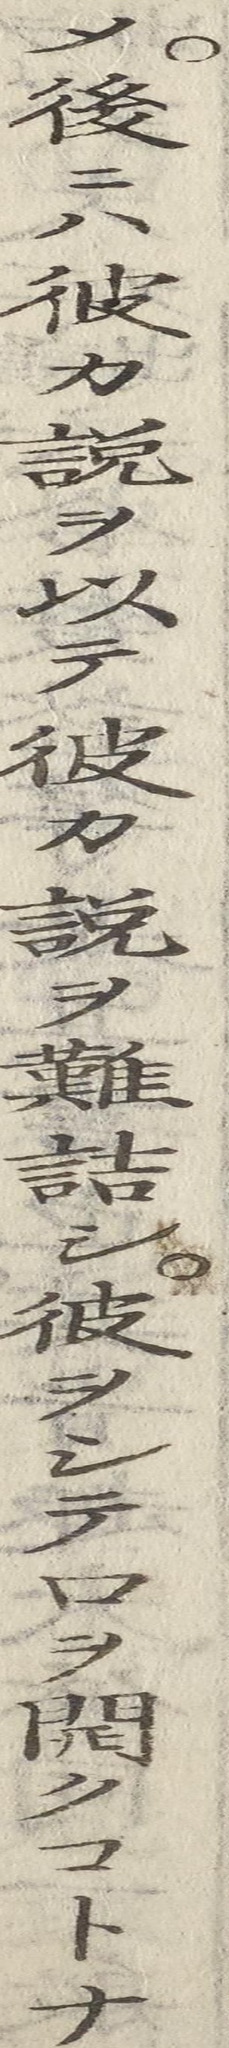メ。後ニハ彼カ説ヲ以テ彼カ説ヲ難詰シ。彼ヲシテ口ヲ開クコトナ
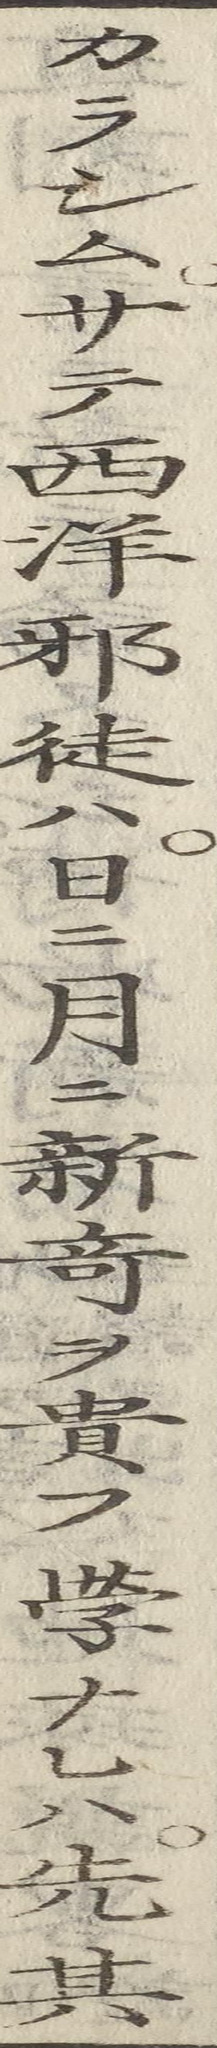カラシム。サテ西洋邪徒ハ。日ニ月ニ新奇ヲ貴フ学ナレハ。先其

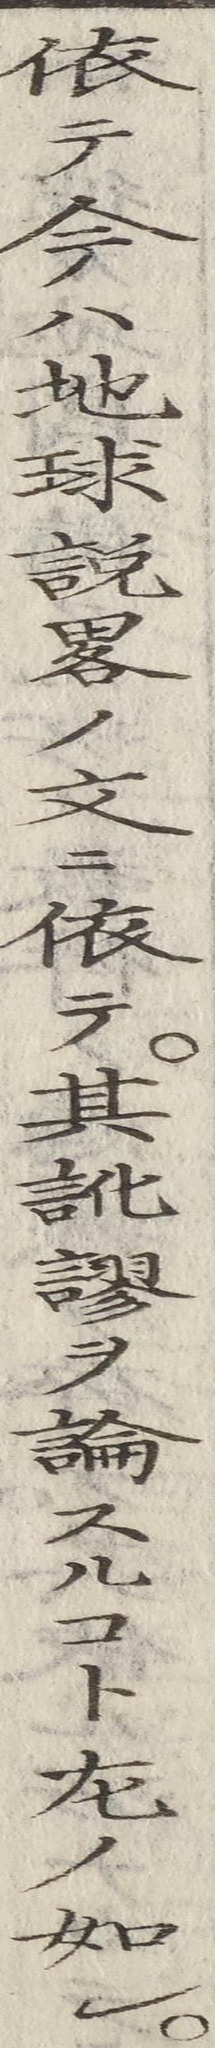依テ今ハ地球説略ノ文ニ依テ。其訛謬ヲ論スルコト左ノ如シ。
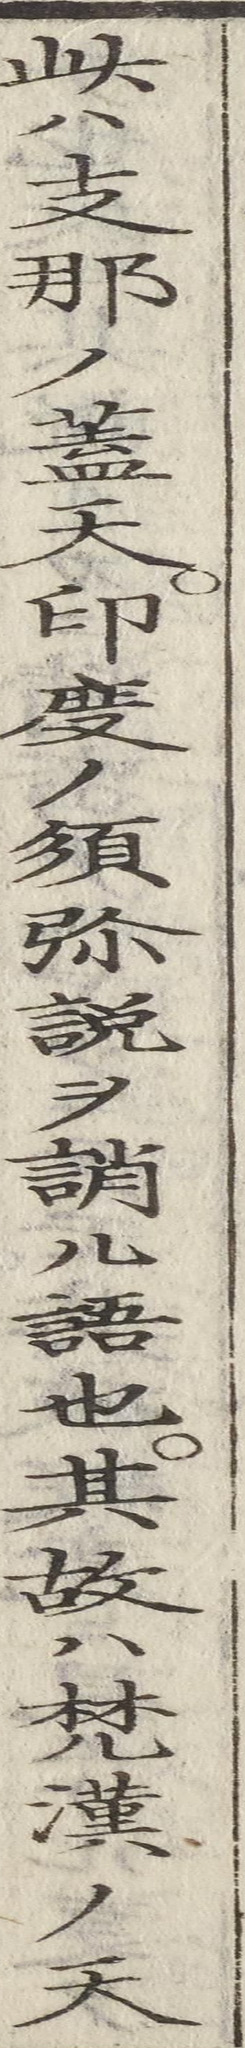此ハ支那ノ蓋天。印度ノ須弥説ヲ誚ル語也。其故ハ梵漢ノ天
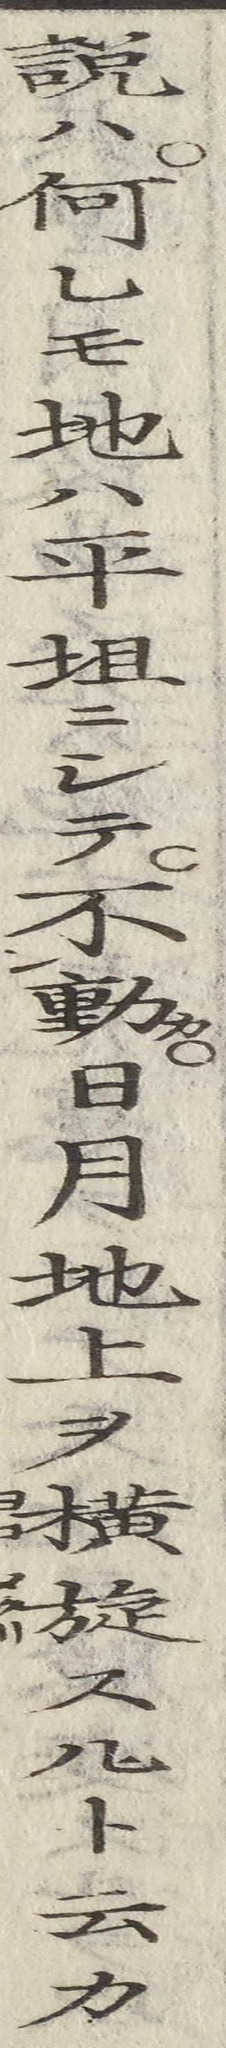説ハ。何レモ地ハ平坦ニシテ。不動。日月地上ヲ横旋スルト云カ
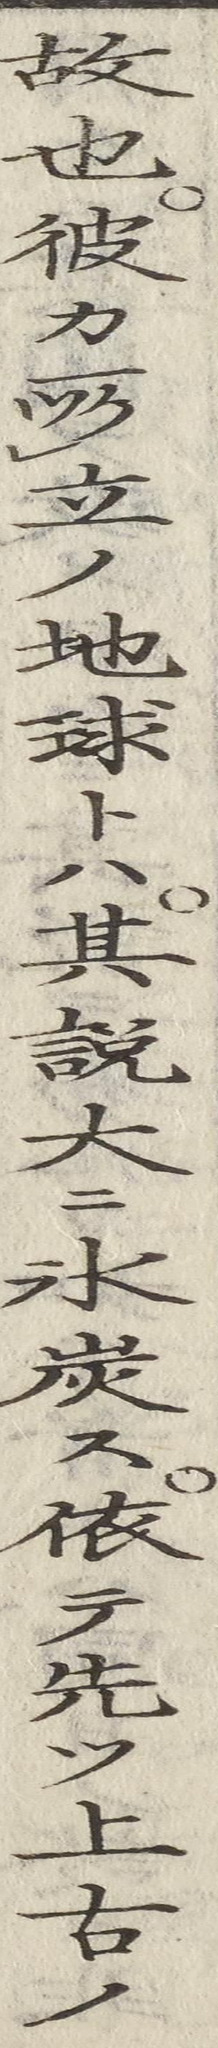故也。彼カ所立ノ地球トハ。其説大ニ氷炭ス。依テ先ツ上古ノ
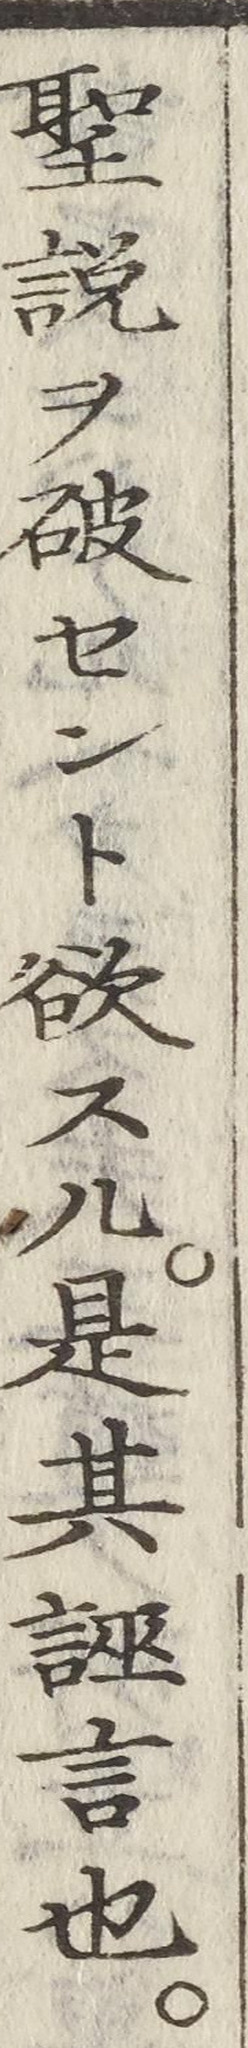聖説ヲ破セント欲スル。是其誣言也。
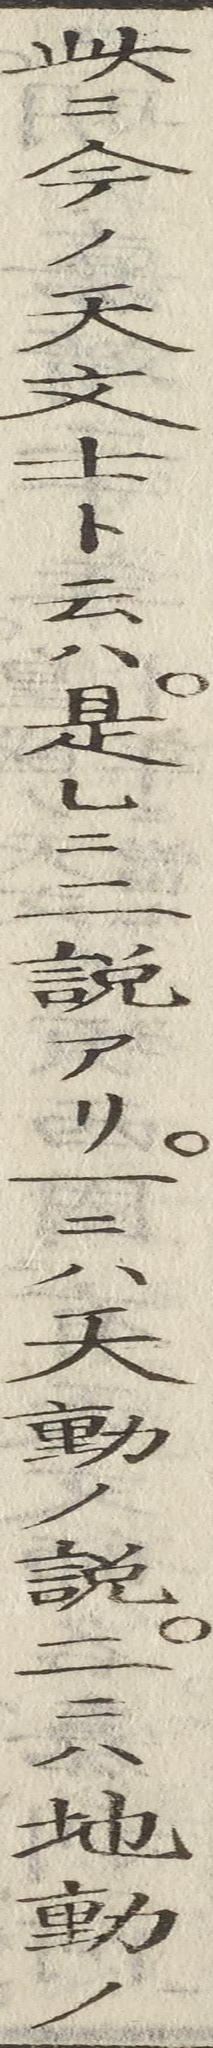此ニ今ノ天文士ト云ハ。是レニ二説アリ。一ニハ天動ノ説。二ニハ地動ノ
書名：護法新論　中
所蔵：東京大学地震研究所図書室 Earthquake Research Institute Library, The University of Tokyo, JAPAN
